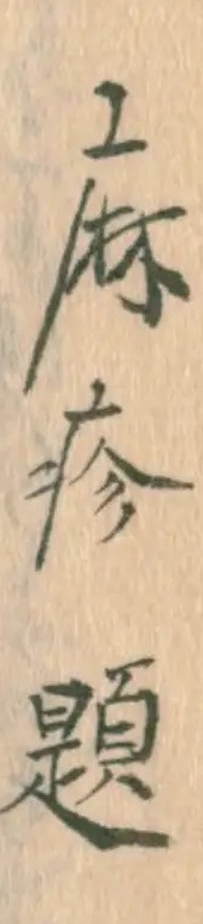麻疹題
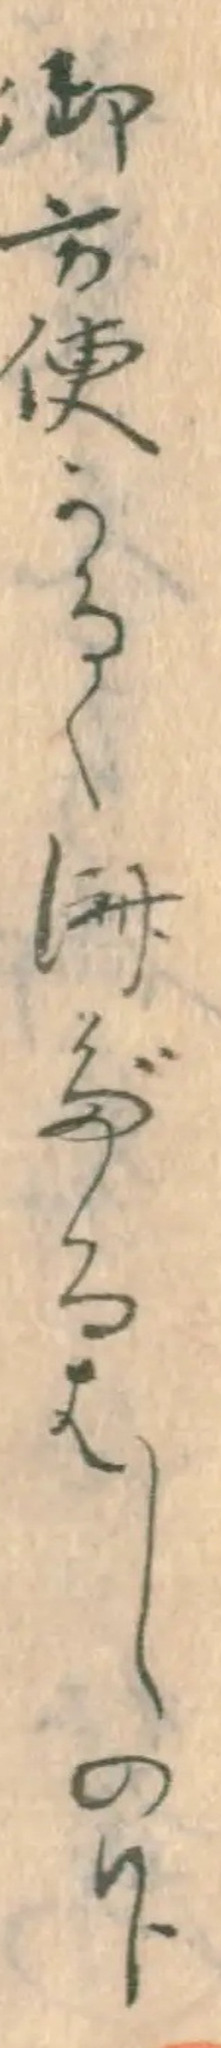御方便かるく済だるはしの下
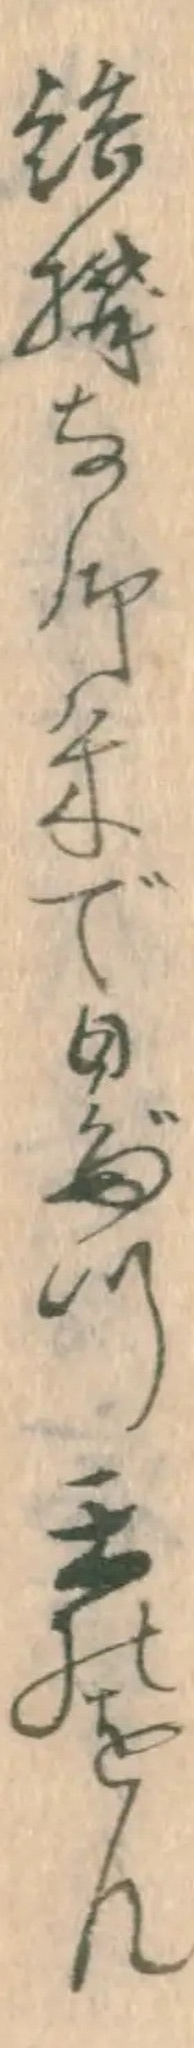結構なお米で目だつ舌のをん
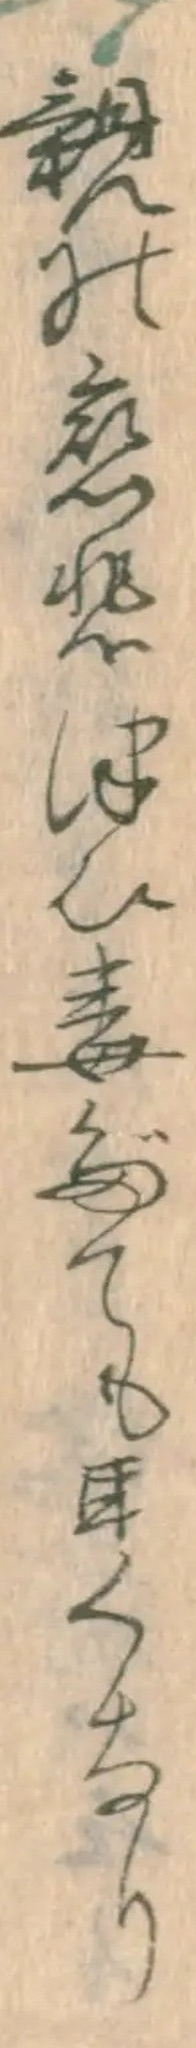親の慈悲つひ毒だても甘くなり
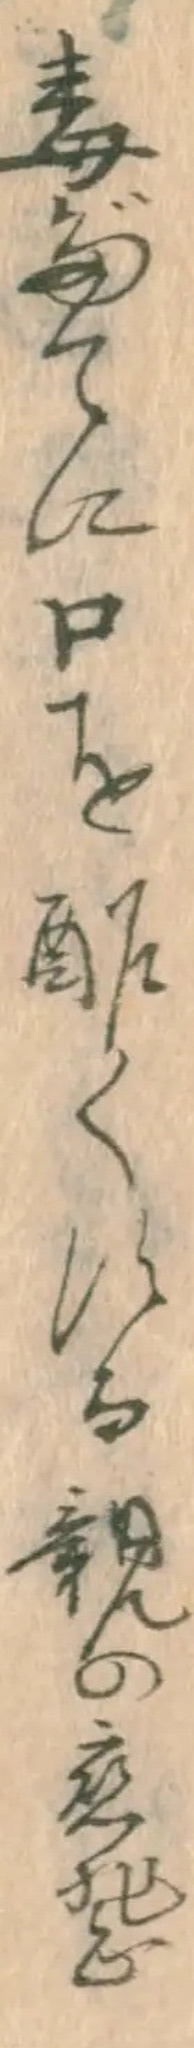毒だてに口を酢くする親の慈悲
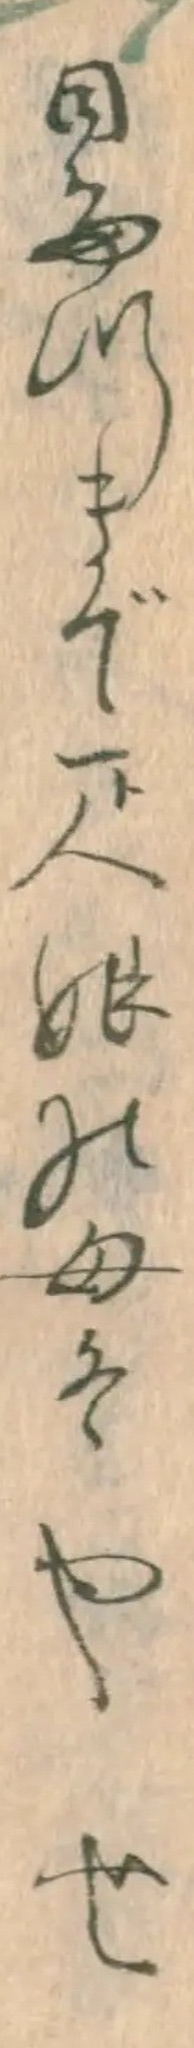目立つまで一ㇳ人娘の母はやせ
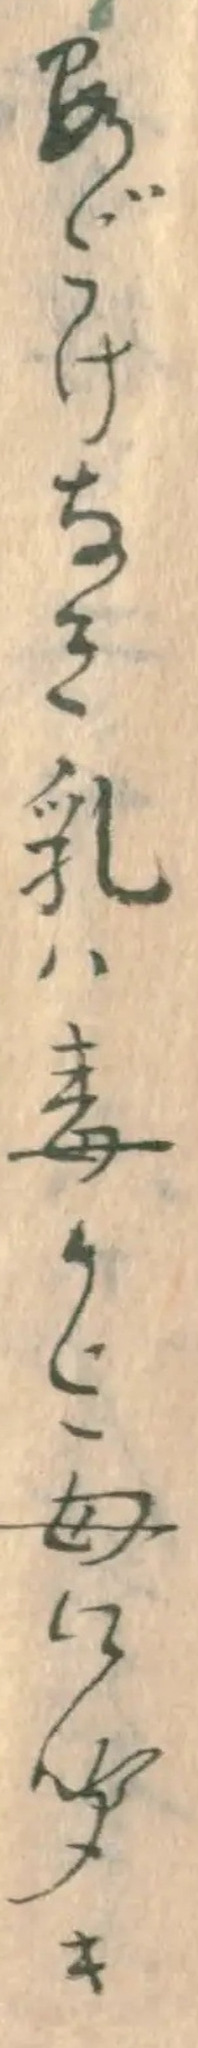あどけなき乳は毒かと母に聞キ
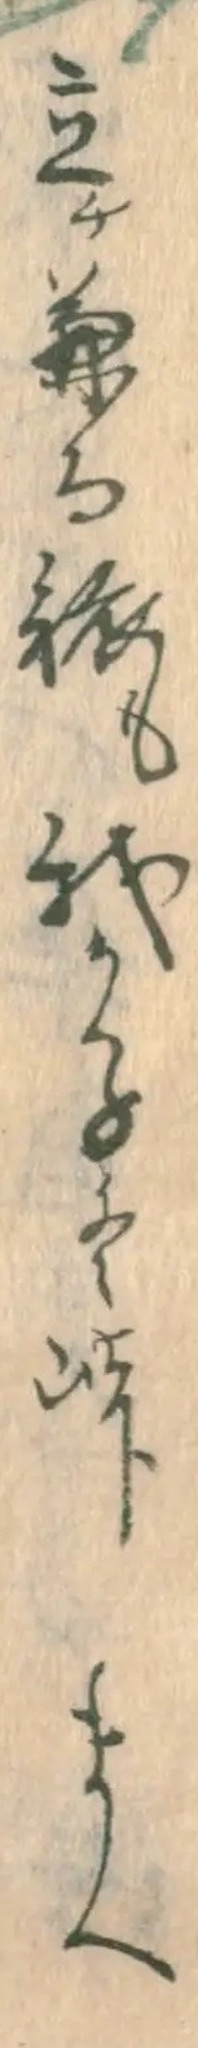立チ兼る旅も我が子は峠まへ
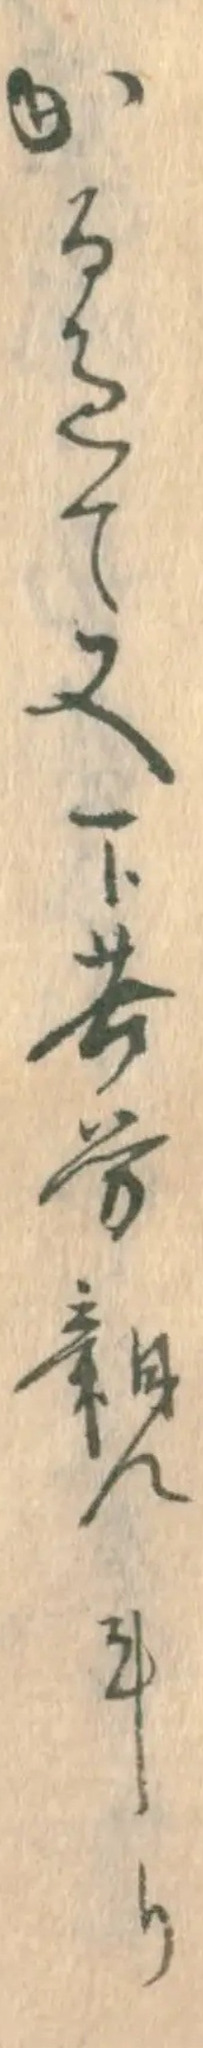かる過て又一ㇳ苦労親斗り
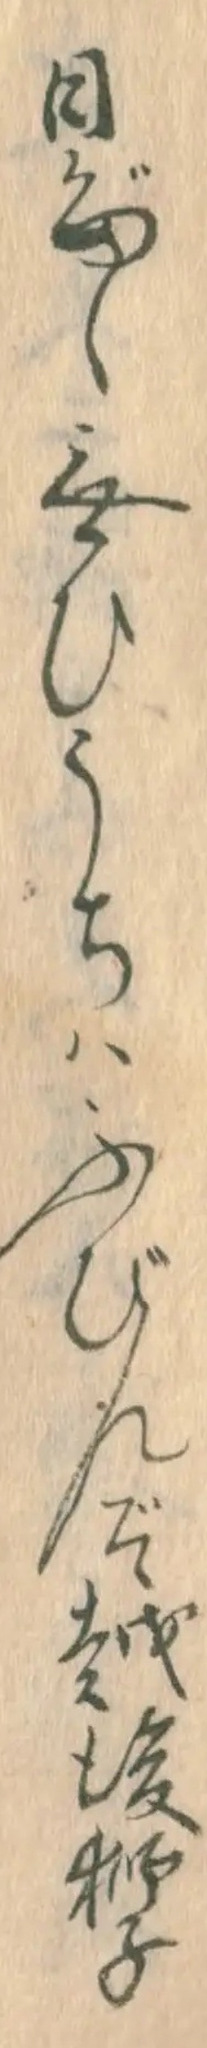目だた無ひうちはふびんぞ越後獅子
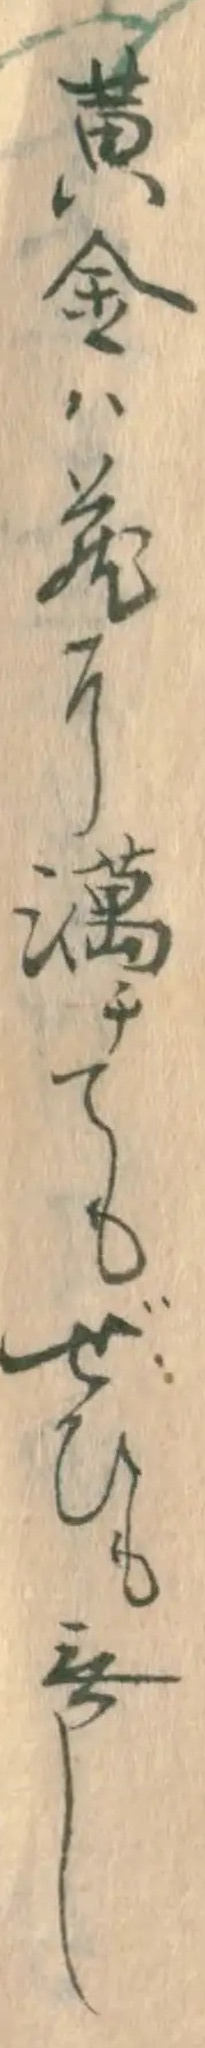黄金は蔵に満チてもぜひも無し

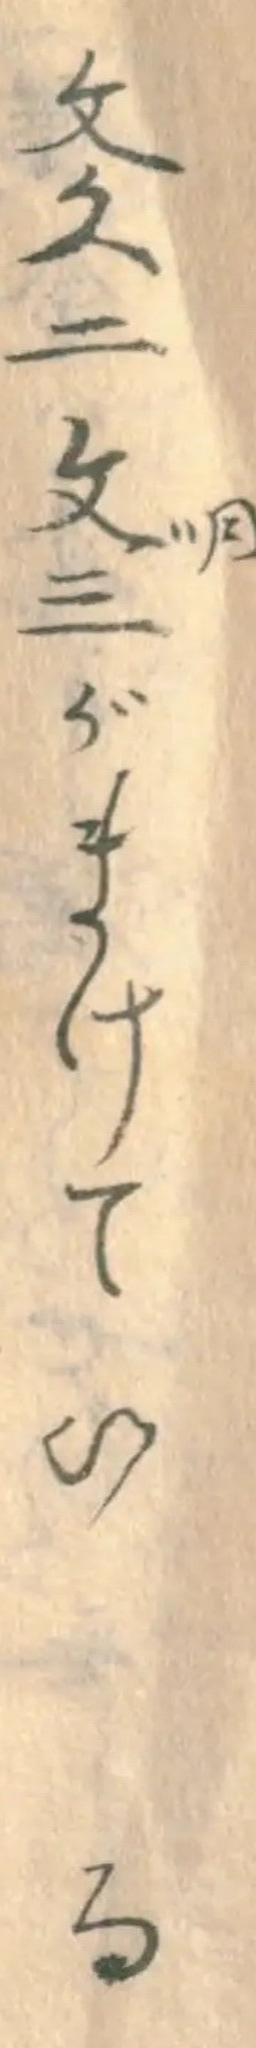文久二文明三がまけている
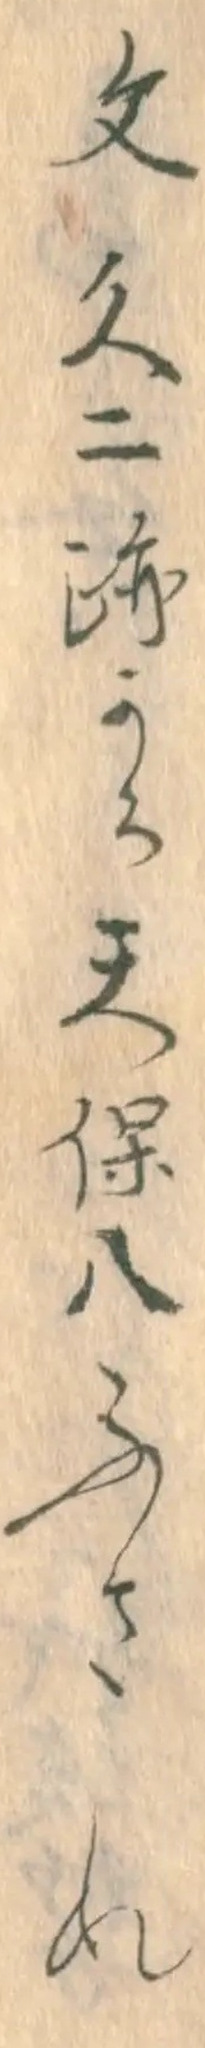文久二跡から天保八にされ
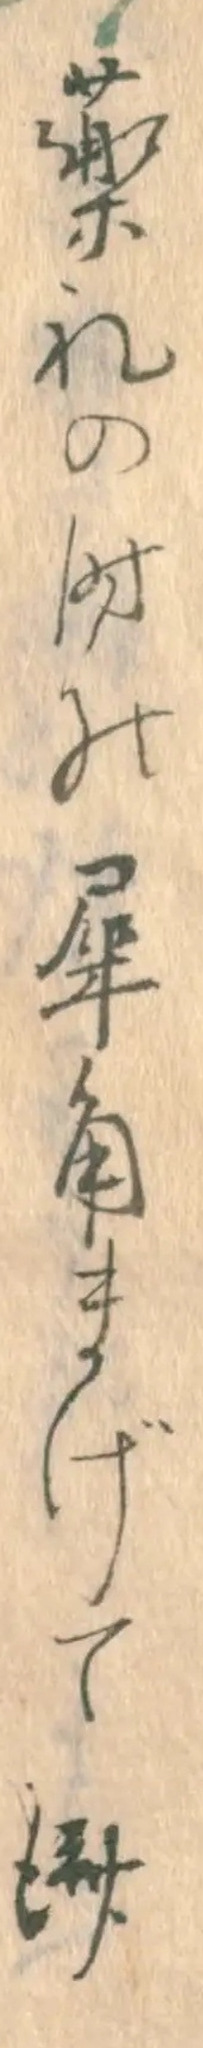薬礼の時の犀角まげて済
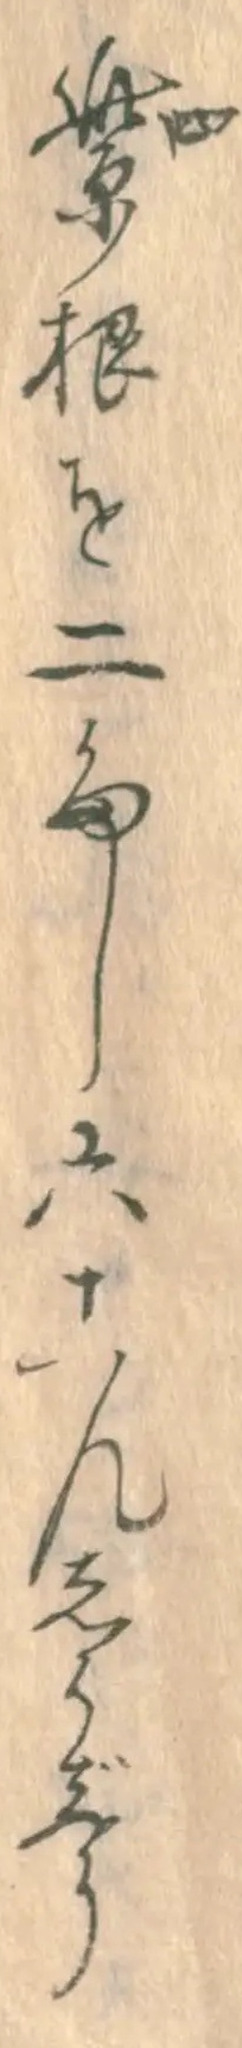紫根を二たし六こんをしうじう
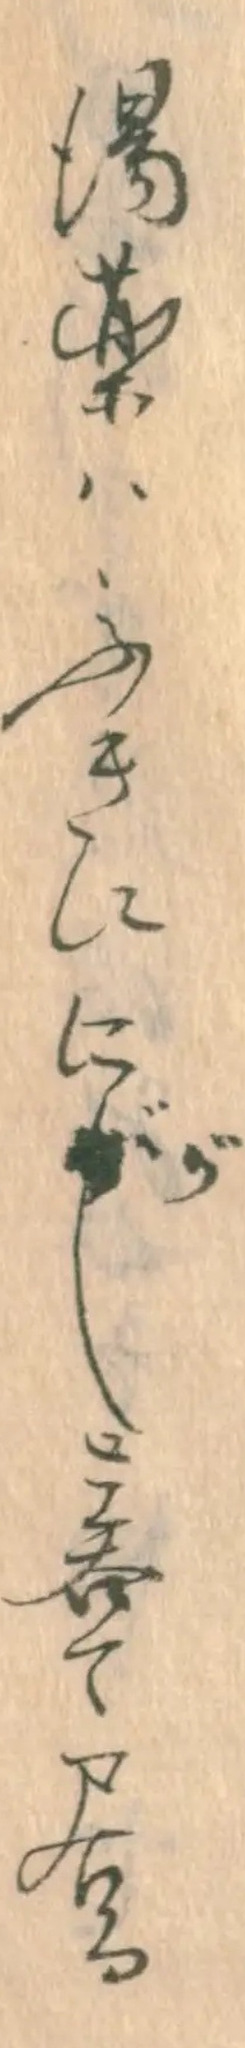湯薬はふきににがしと呑て居る
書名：麻疹後柳樽
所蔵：国立国会図書館 National Diet Library, JAPAN
